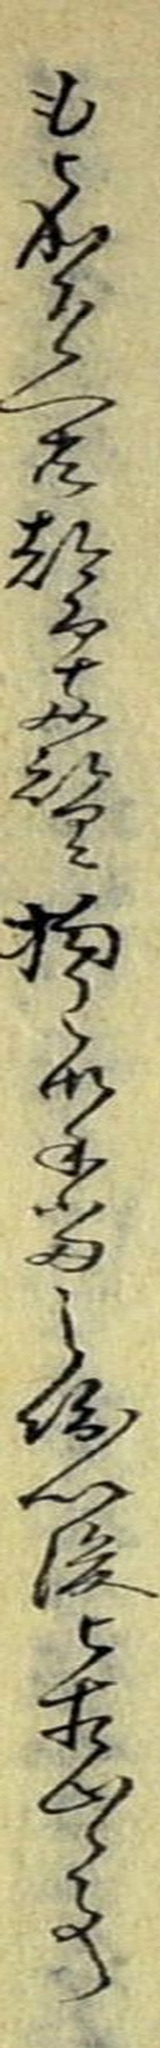も被成下候へ共都而両替に拘り候御手当之儀以後被相止候事
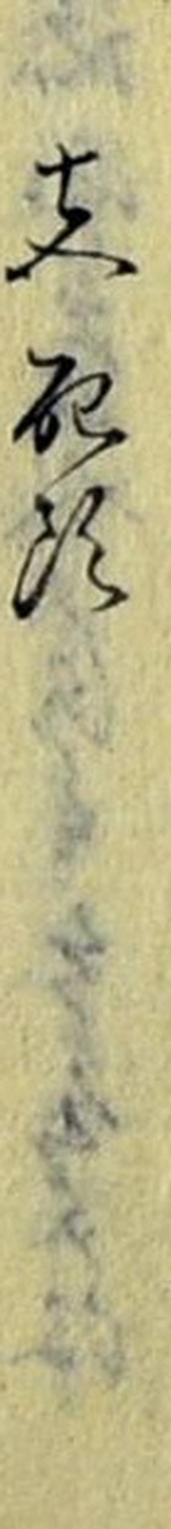支配頭
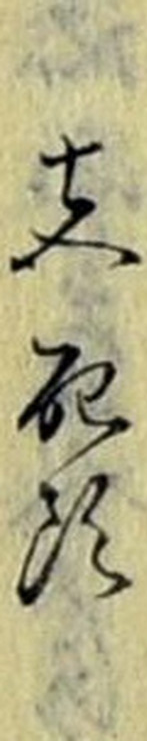支配頭

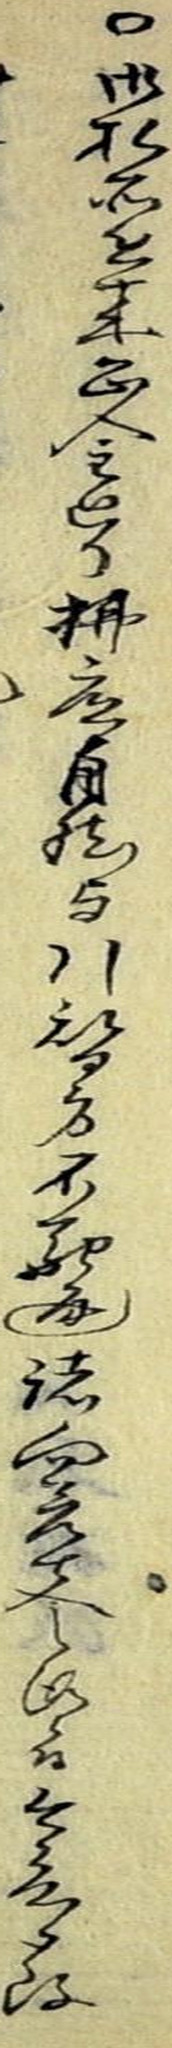○御札所近来正金廻り払底自然と引替不融通諸向差支候趣に付今度御改
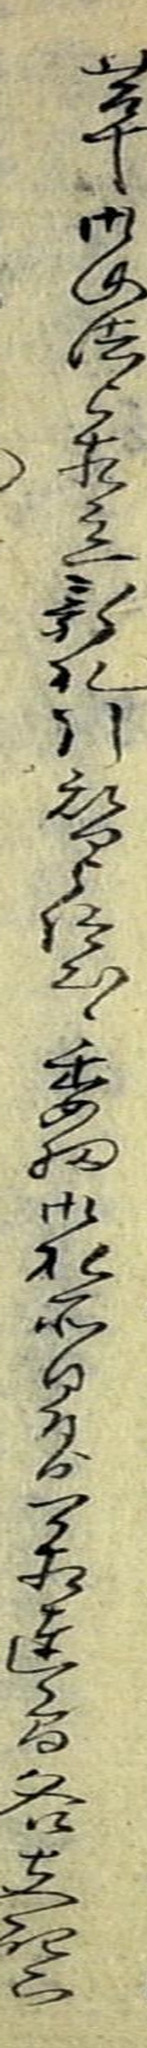革御趣法被相立新札引替被仰出候委細御札所目付ゟ可相達候間各支配下
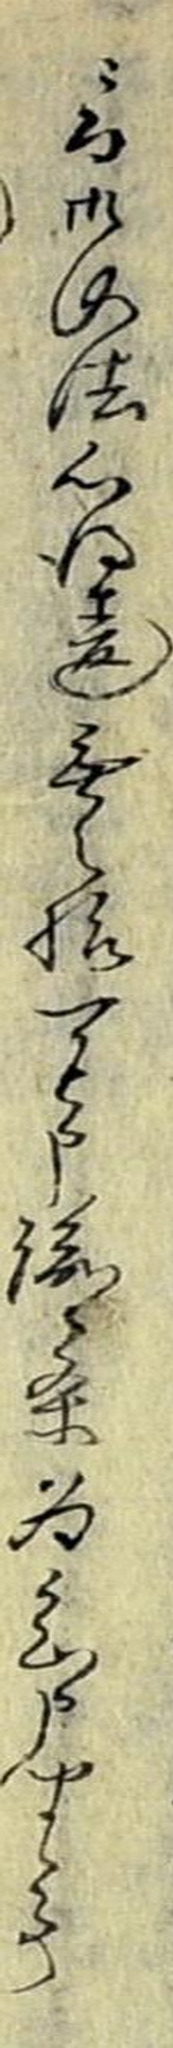に而御趣法心得違無之様可被申渡候条為念申聞候事
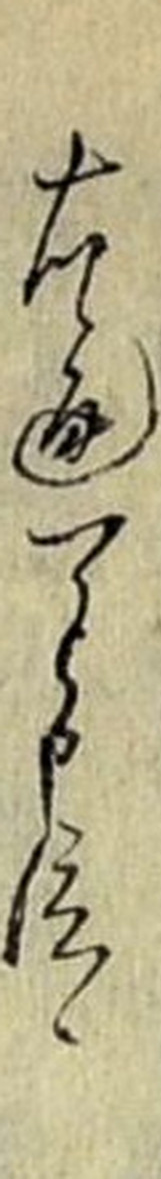右之通可被申渡候
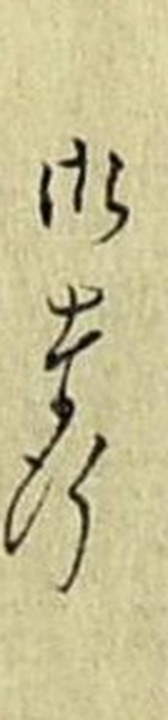御奉行
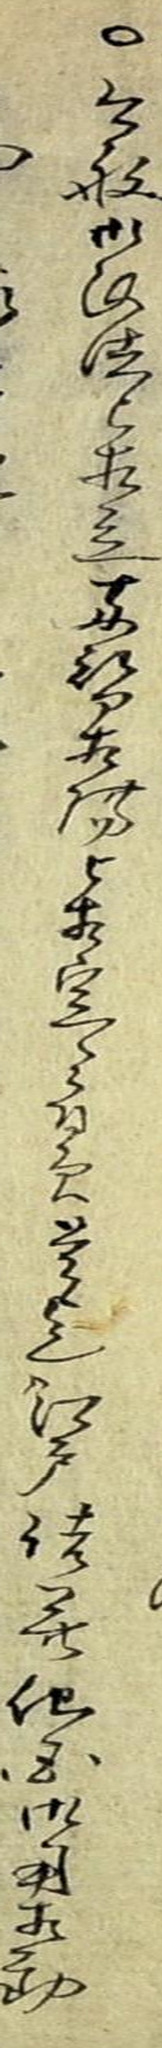○今般御趣法被相立両替相場被相定候に付而は是迄江戸詰并他国御用相勤
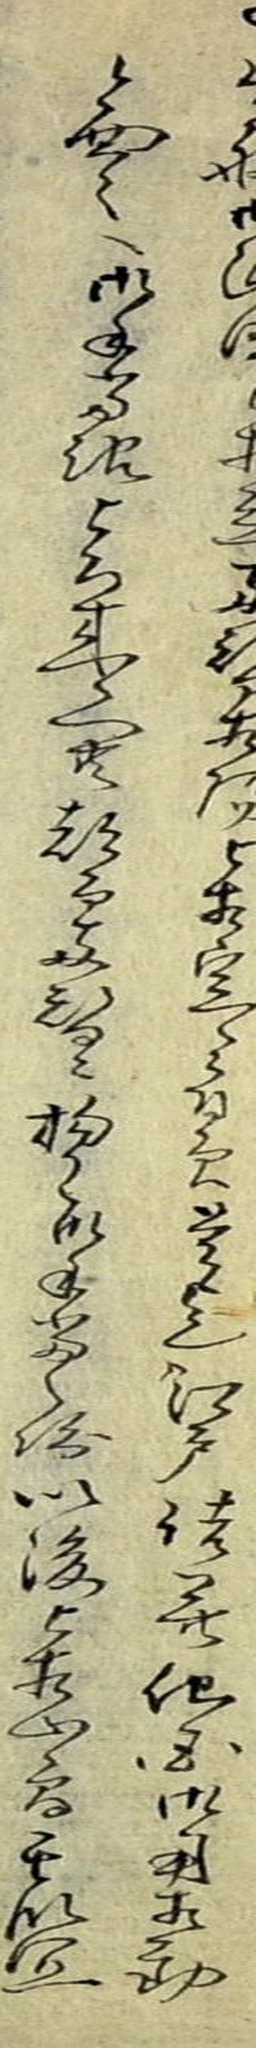候面々へ御手当銀被下来候へ共都而両替に拘り候御手当之儀は以後被相止候間其段宜
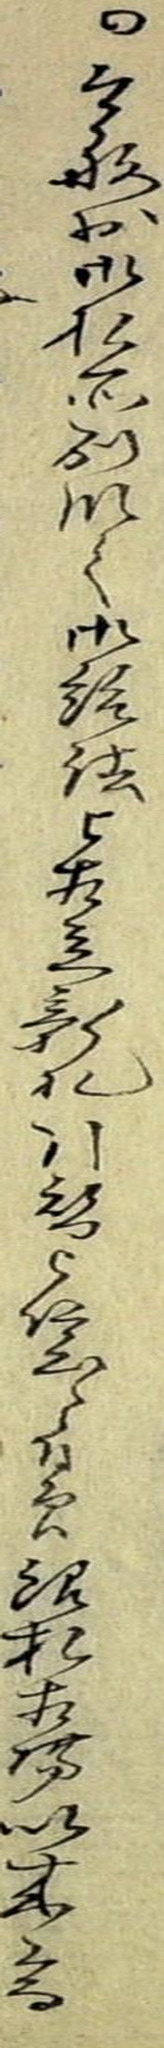○今般於御札所別段之御趣法被相立新札引替被仰出候に付而は銀札相場以來高
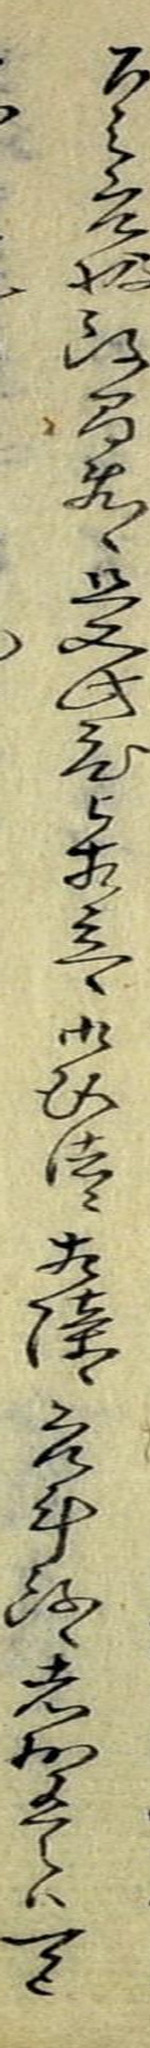下之取扱致間敷候且又此度被相立候御趣法に相障候取斗致候者於有之は可
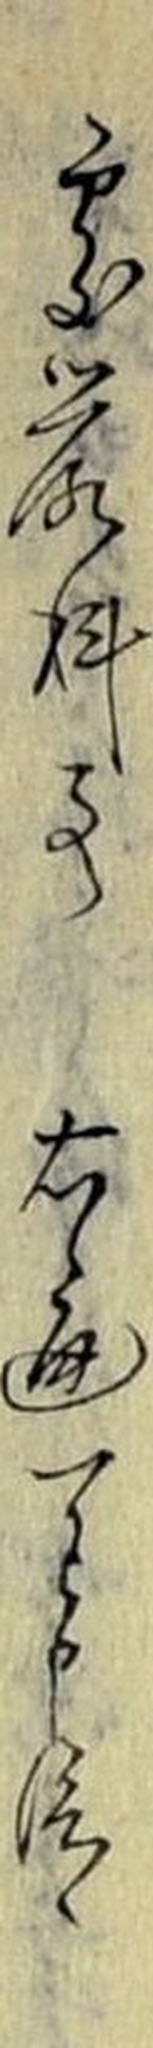然厳科事右之通可被申渡候
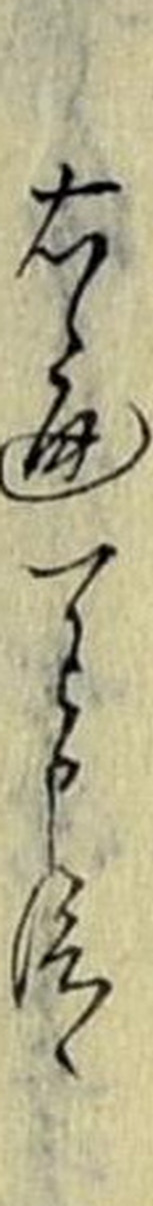右之通可被申渡候
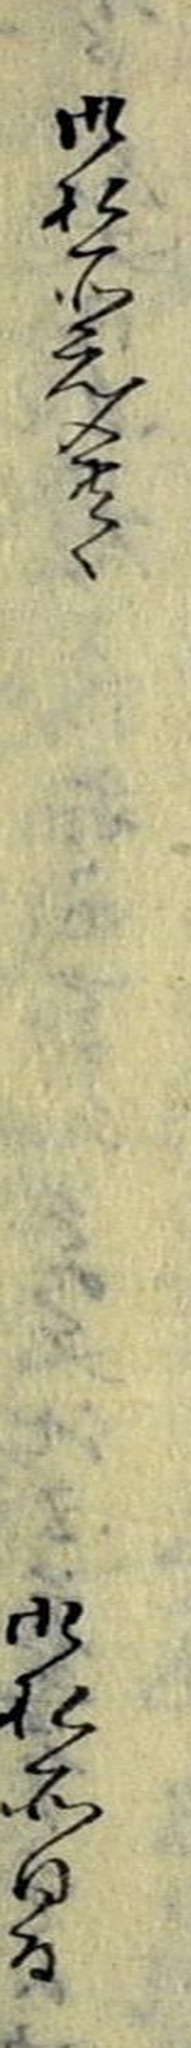御札所元〆共へ御札所目付
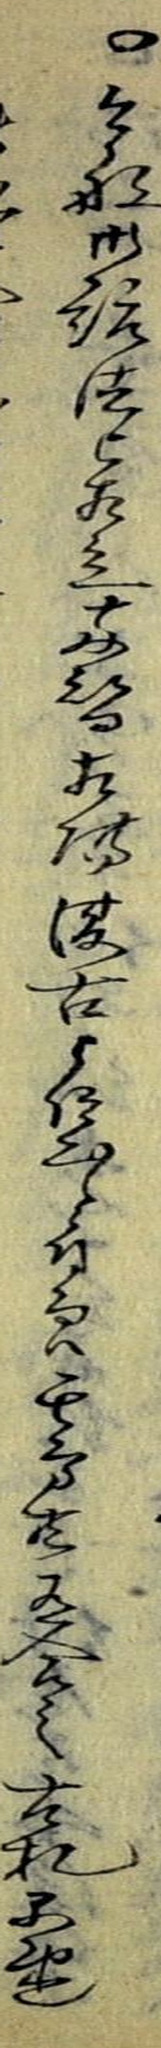○今般御趣法被相立両替相場復古被仰出候に付而は其方共有合之古札早速
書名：命令之部 六
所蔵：福井県文書館 Fukui Prefectural Archives
